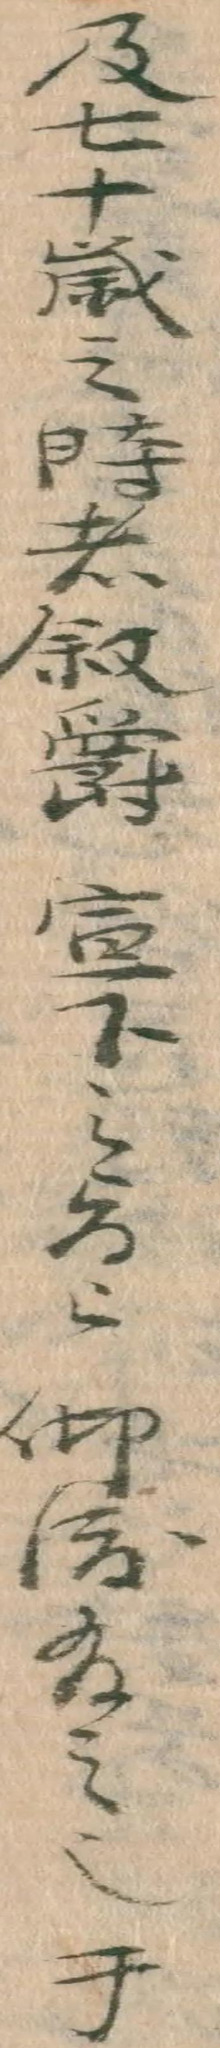及七十歳之時者叙爵宣下之旨被仰渡有之也于
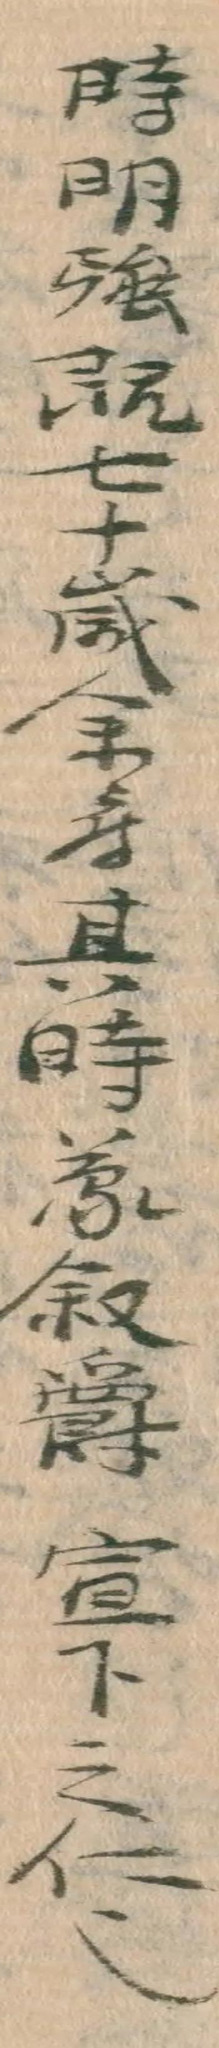時明強既七十歳余ニ付其時蒙叙爵宣下之仁也
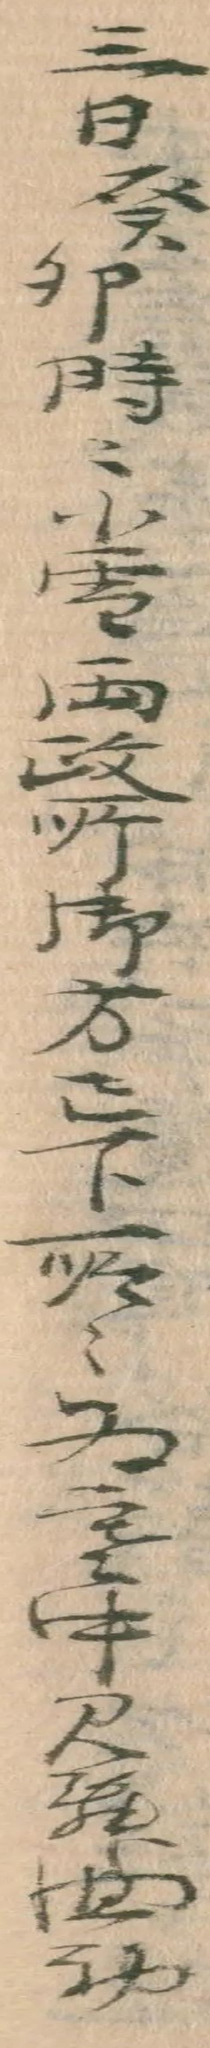三日癸卯時々小雪両政所御方已下所々為寒中見残回勤
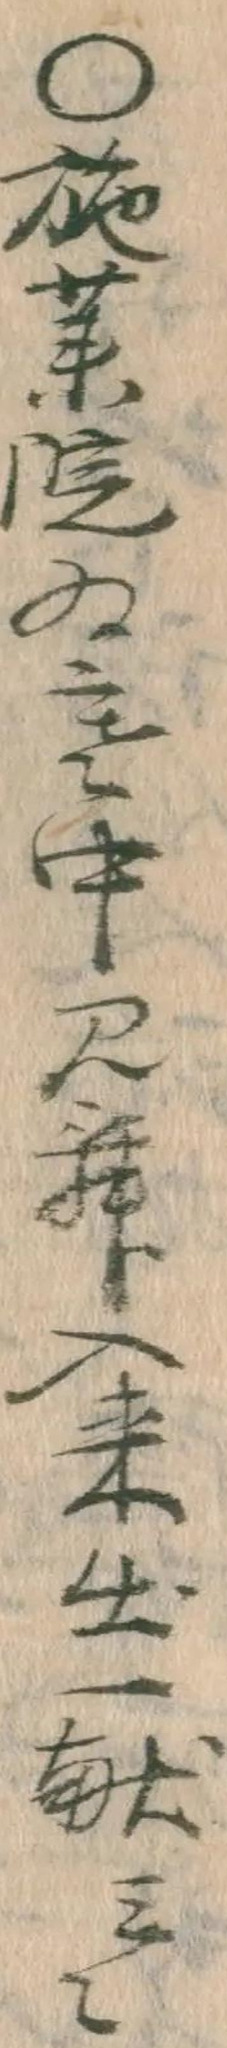○施薬院寒中見舞入来出一献云々
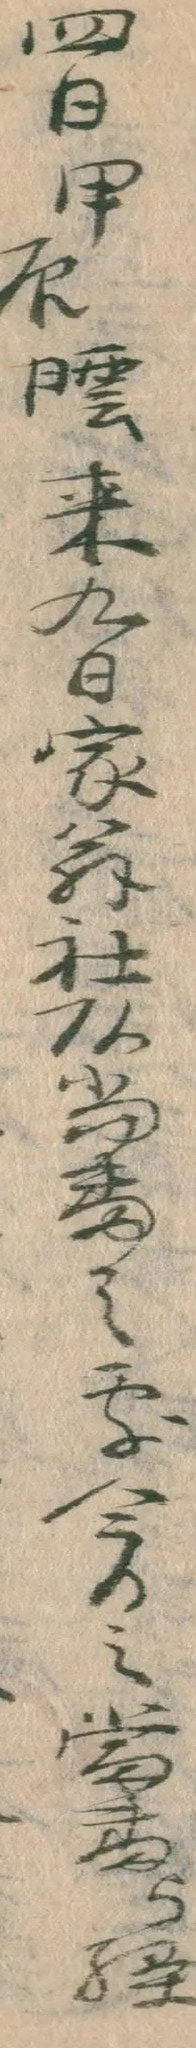四日甲辰晴来九日家翁社頭當番之處今日之當番と繰
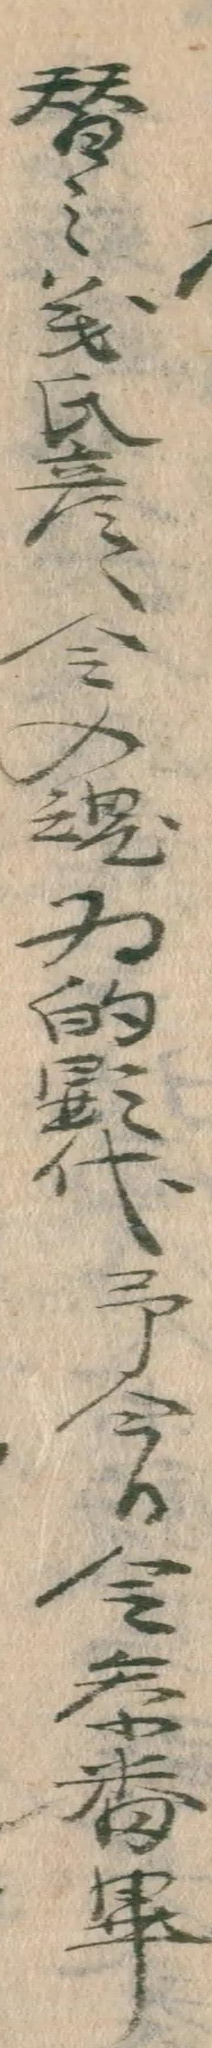替之義氏彦へ令入魂為的顕代予今日令参番畢
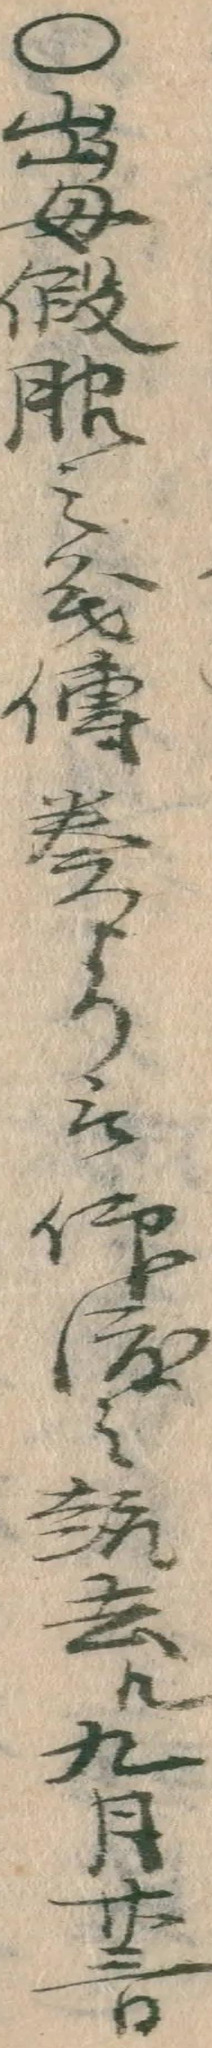○出母仮服之義傳奏より被仰渡之趣去ル九月廿三日
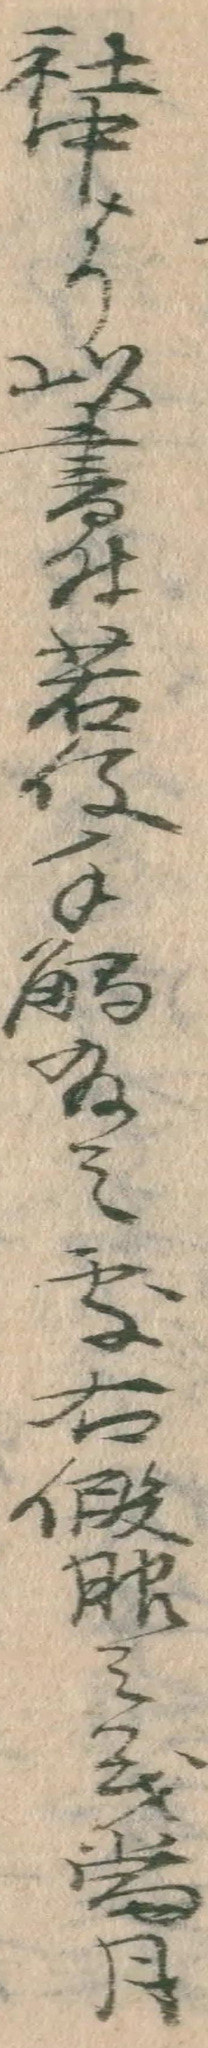社中より以書付若役手触有之處右仮服之義當月
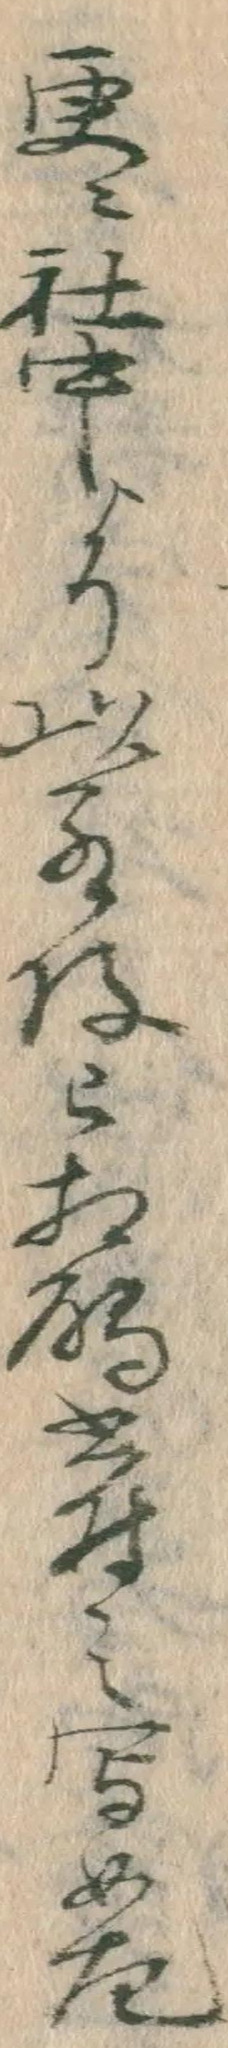更に社中より以前後被相触書付之写如左
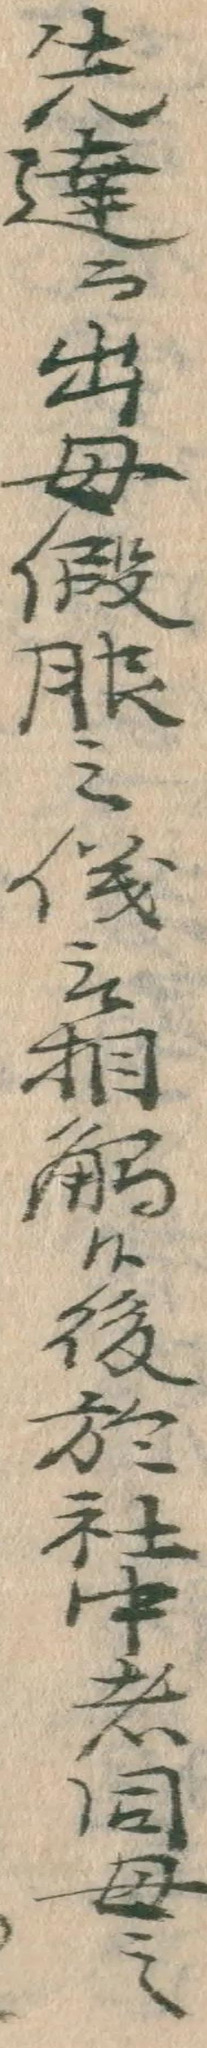先達而出母仮服之儀被相触候後於社中者同母之
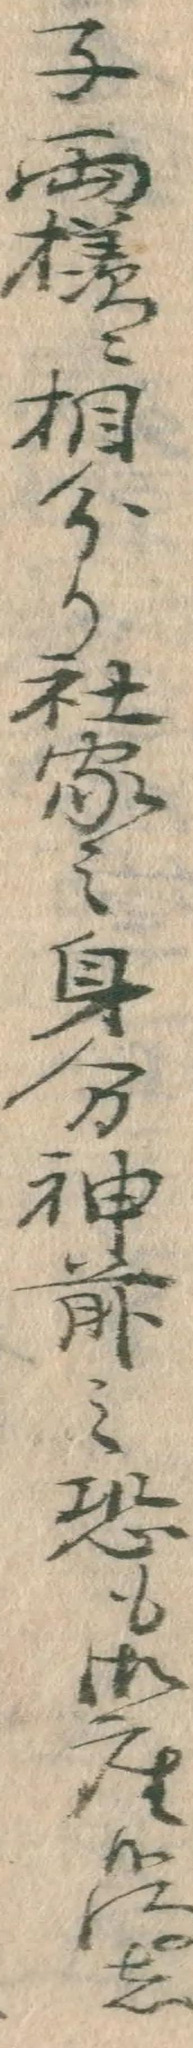子両様ニ相分り社家之身分神前之恐も御座候得者
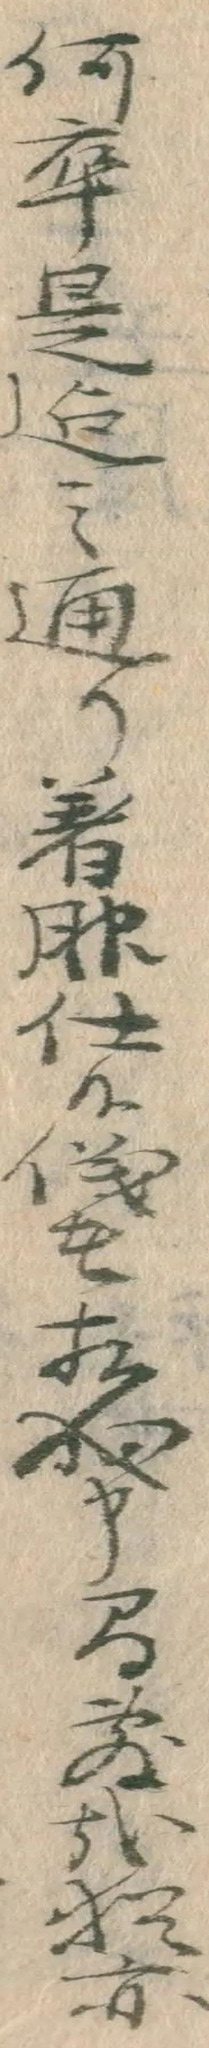何卒是迄之通り着服仕候儀も相成申間敷哉猶亦
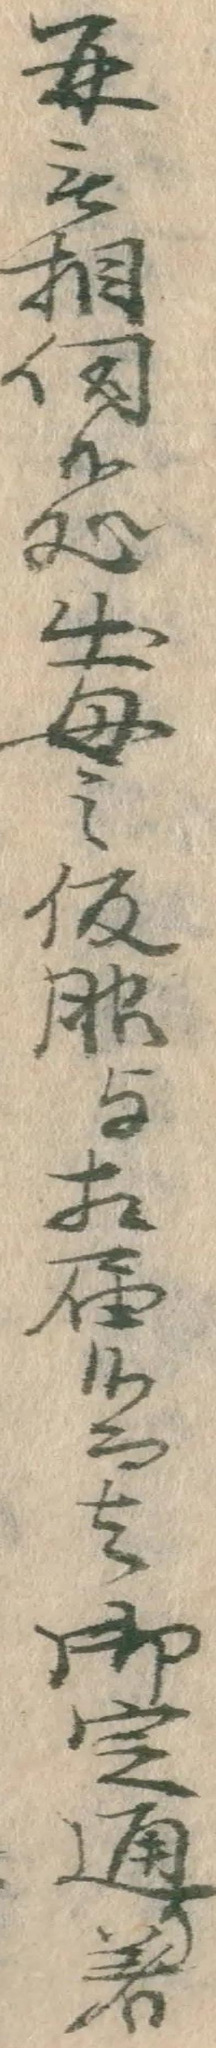再被相伺候処出母之仮服と相届候而者御定通リ着
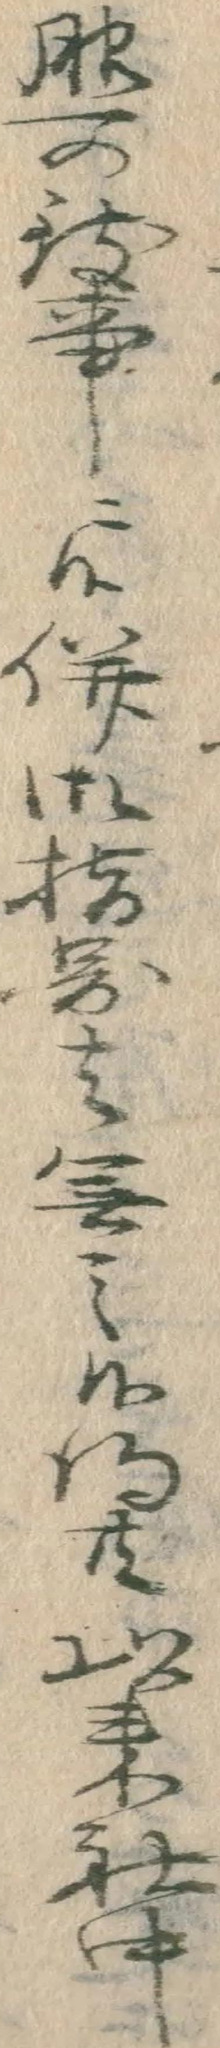服可致事ニ候併御指図者無之候得共以来社中
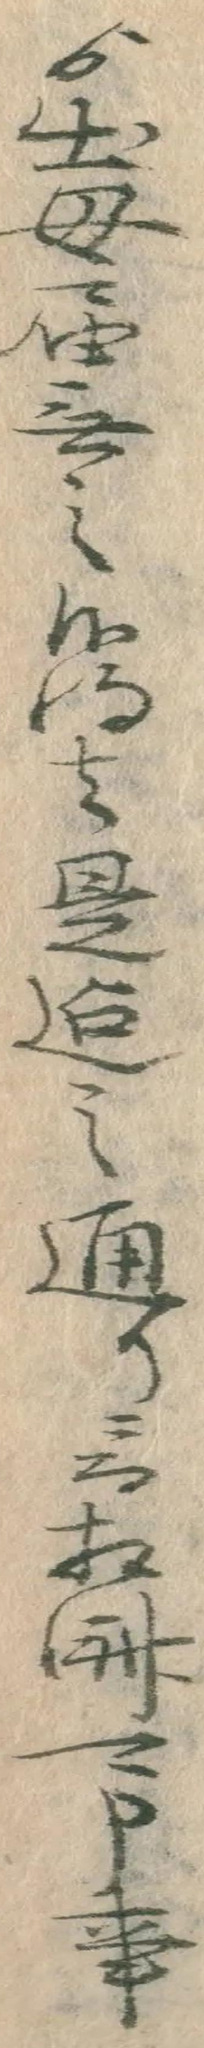ゟ出母届無之候得者是迄之通リニ而相済可申事

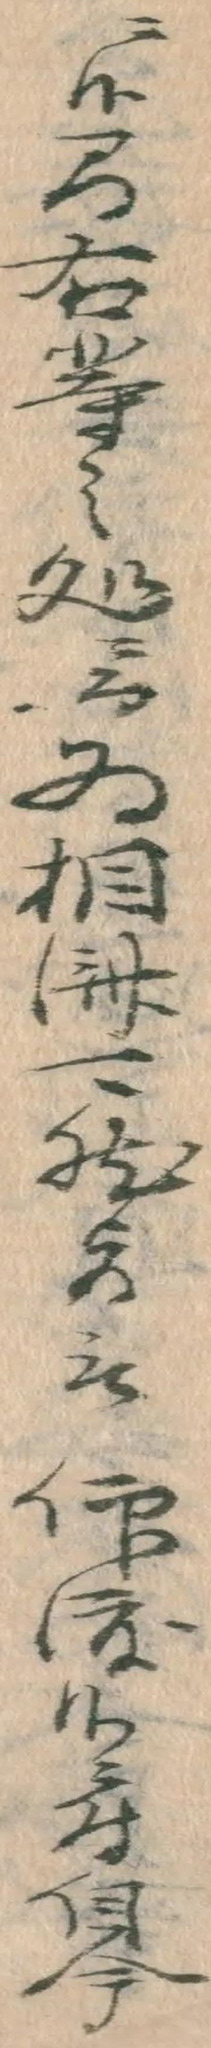ニ候間右等之処ニ而為相済可然旨被仰渡候ニ付自今
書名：賀茂社記録. 第63冊
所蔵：国立国会図書館 National Diet Library, JAPAN
